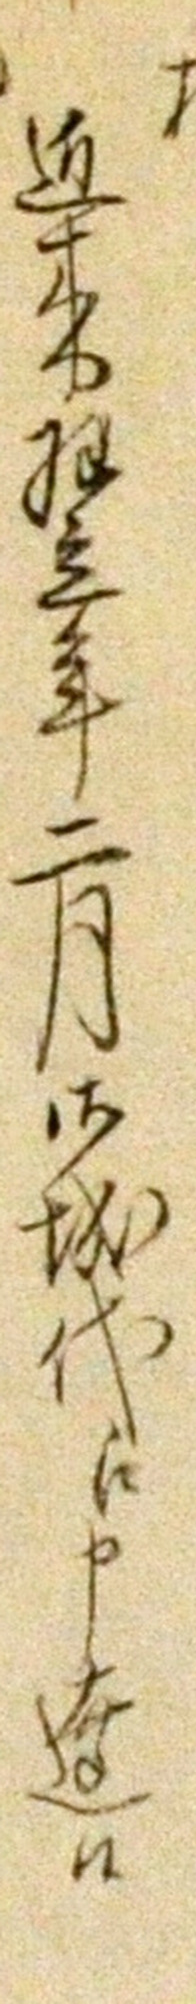近来翌年二月御城代え申達候
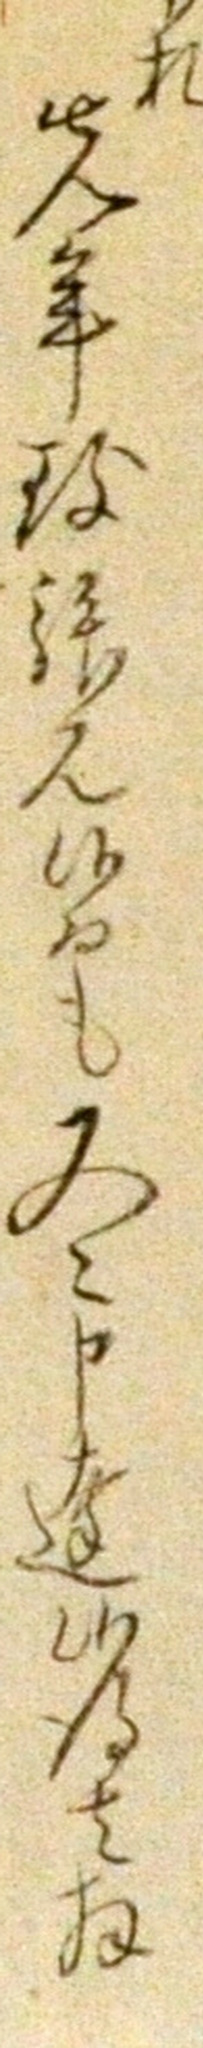先年致拝見候而も又々申達候得は拝
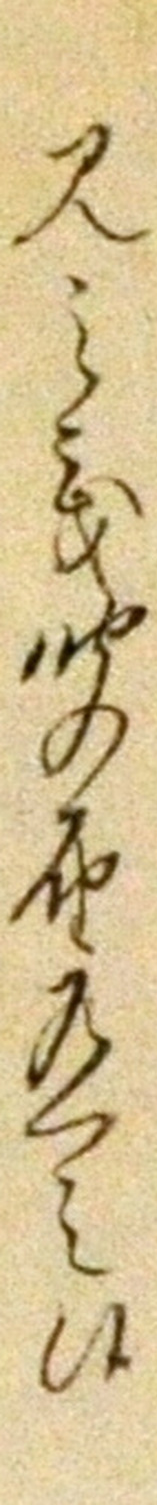見之義聞届有之候
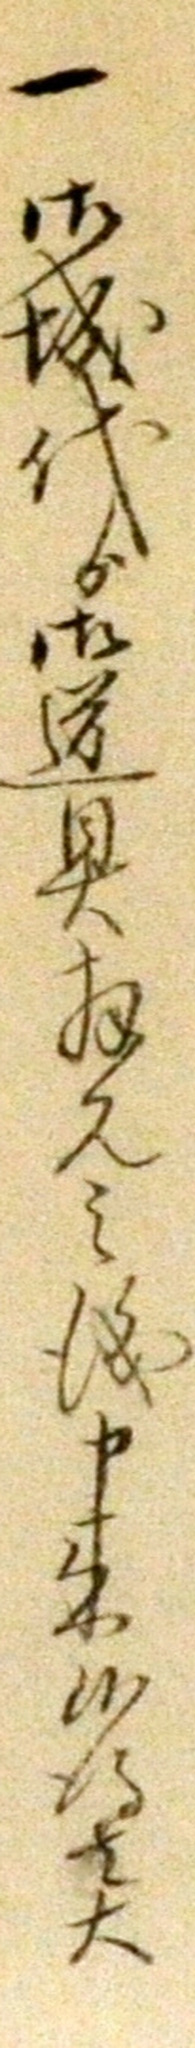一御城代ゟ御道具拝見之儀申来候得は大
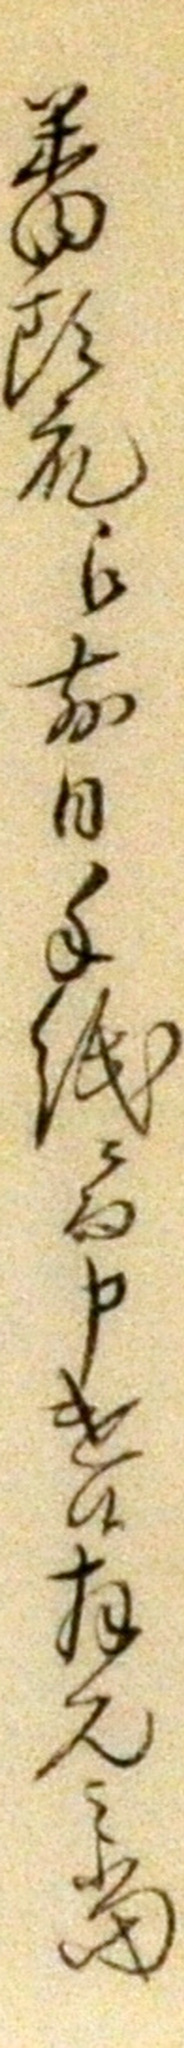番頭衆え前日手紙二而申遣候拝見之当
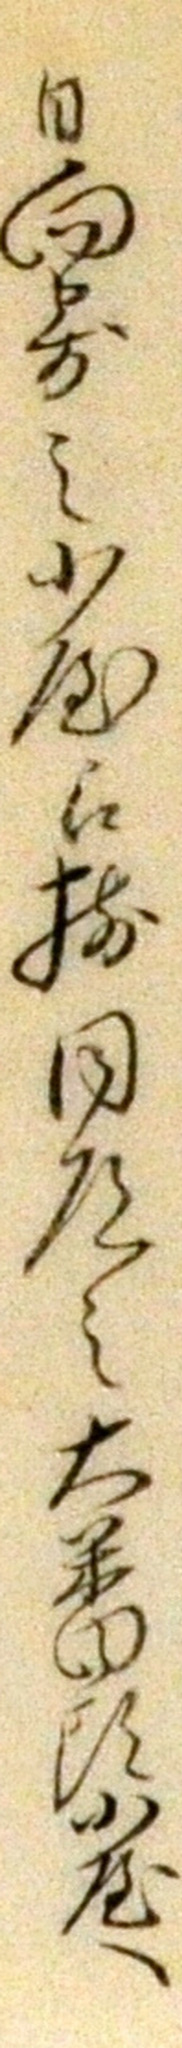日向寄之小屋え揃同道之大番頭小屋へ
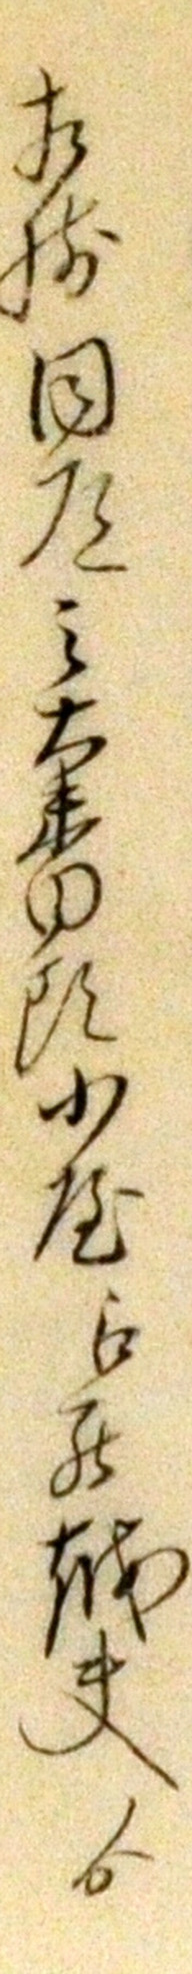相揃同道之大番頭小屋え罷越夫ゟ
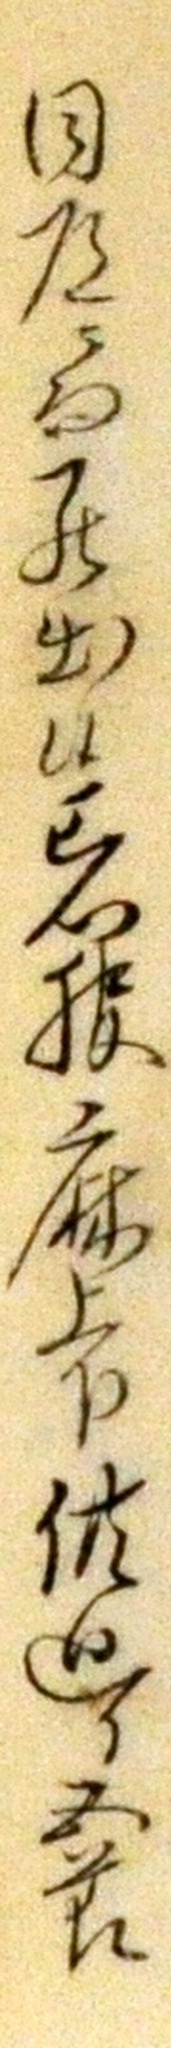同道ニ而罷出候着服麻上下供廻り五節
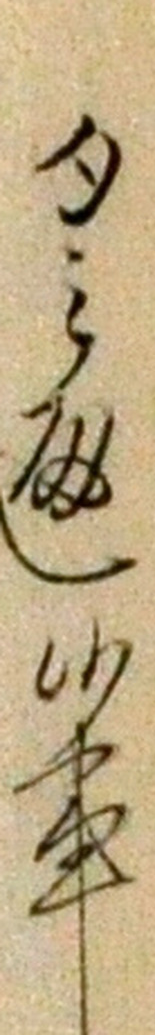句之通候事
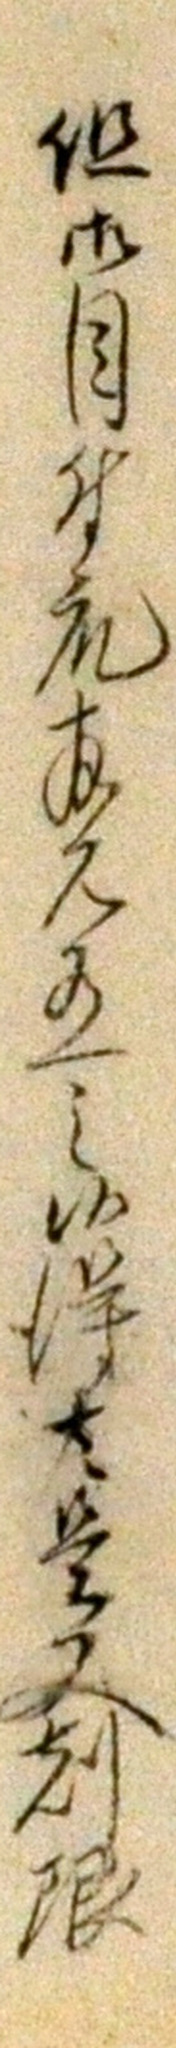但御目付衆拝見有之候得は是又刻限
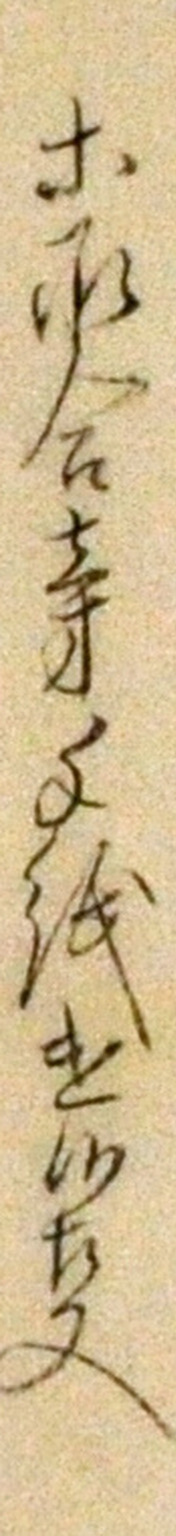等承合旁手紙遣候事
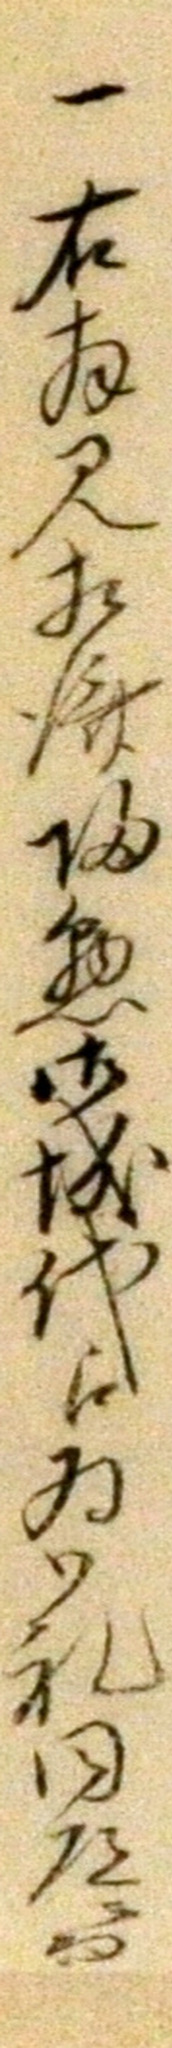一右拝見相済帰懸御城代え為御礼同道ニ而
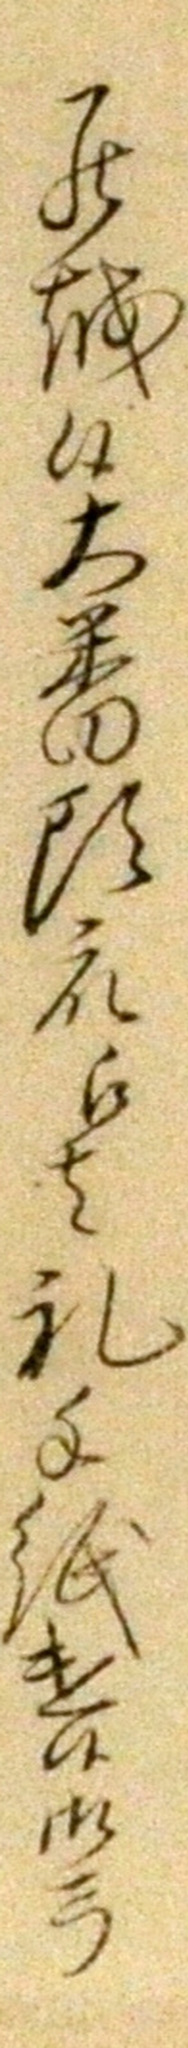罷越候大番頭衆えは礼手紙遣候御弓
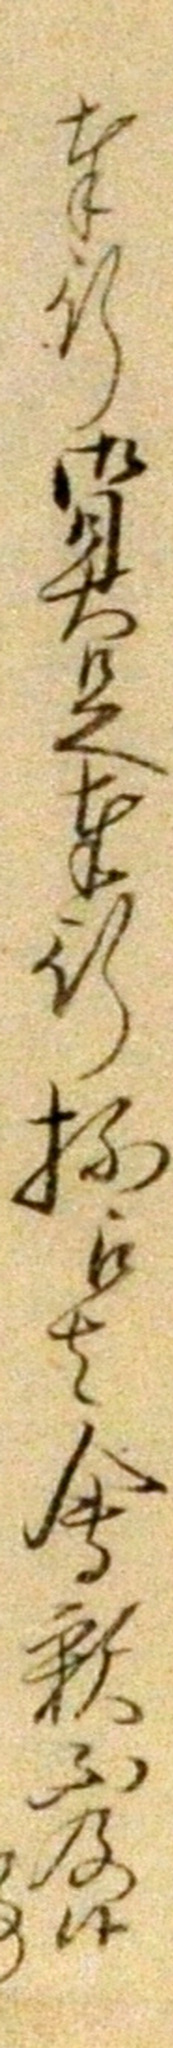奉行御具足奉行抔えは会釈不及候事
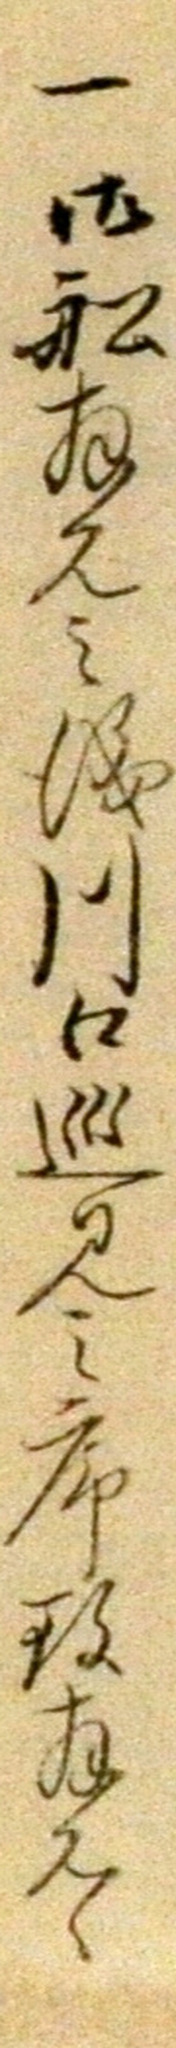一御船拝見之儀川口巡見之席致拝見候
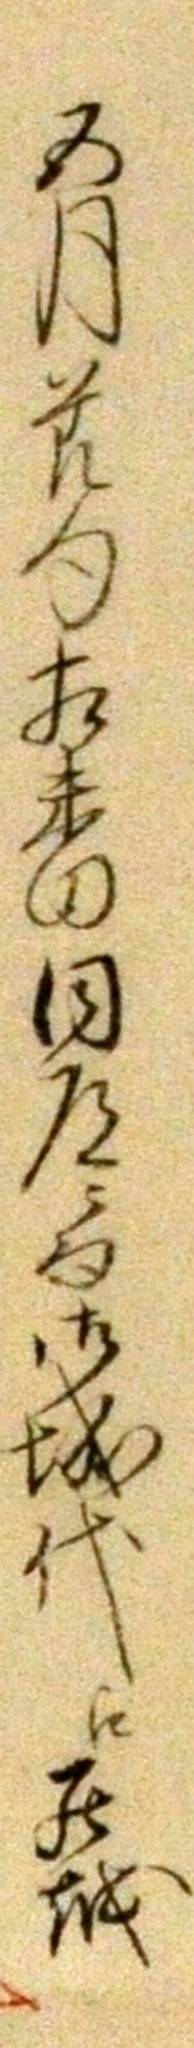五月節句相番同道ニ而御城代え罷越
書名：大阪加番関係諸書留〔一括〕
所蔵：伊那市立高遠町図書館・合同会社AMANE
